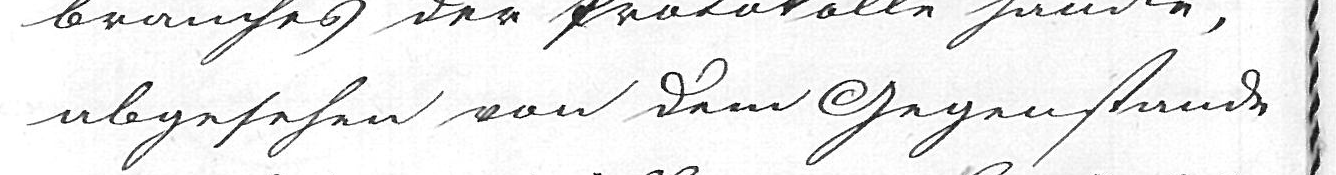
abgesehen von dem Gegenstande
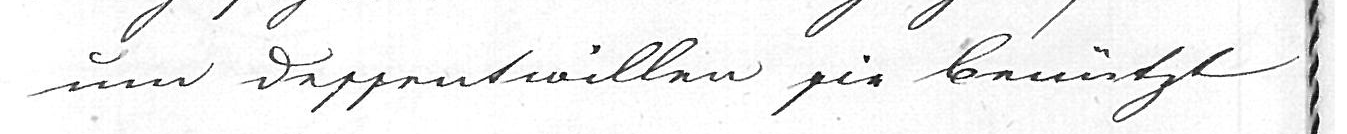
und dessentwillen sie benützt
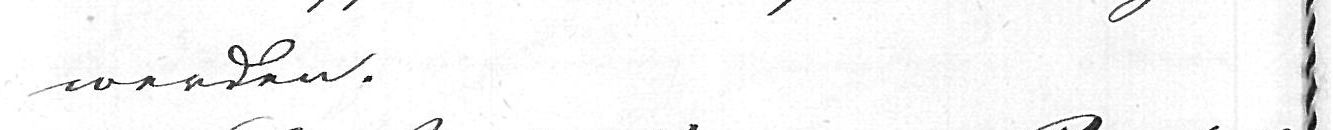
werden.
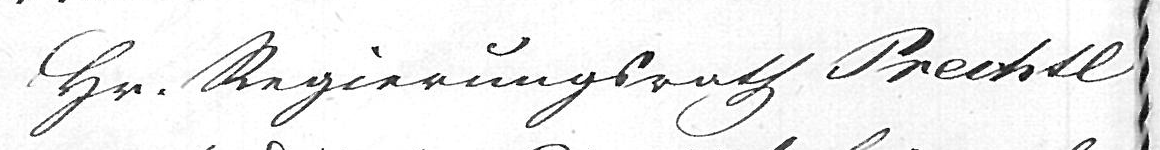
Hr. Regierungsrath Prechtl
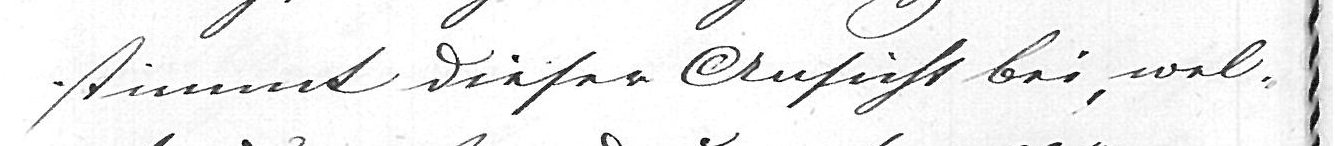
stimmt dieser Ansicht bei, wel-
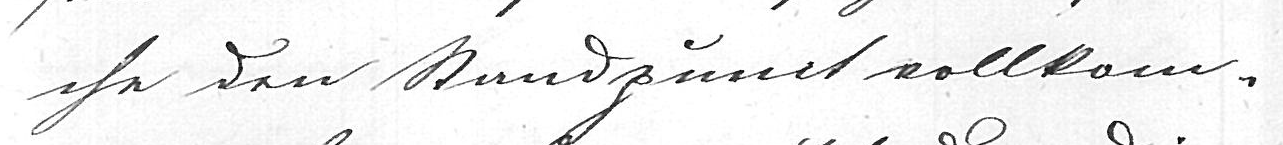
che den Standepunct vollkom-
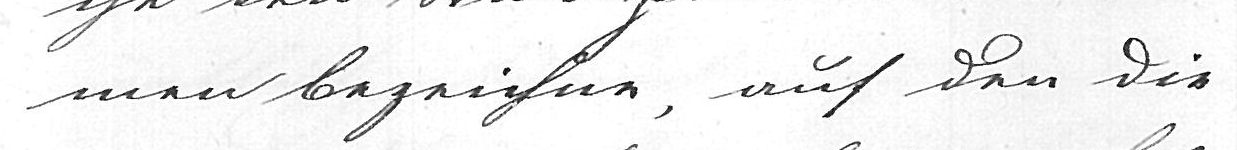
men bezeichne, auf den die
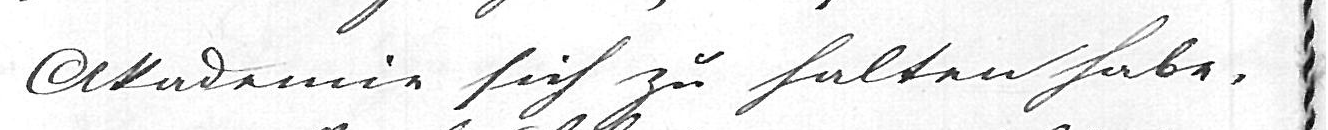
Akademie sich zu halten habe.
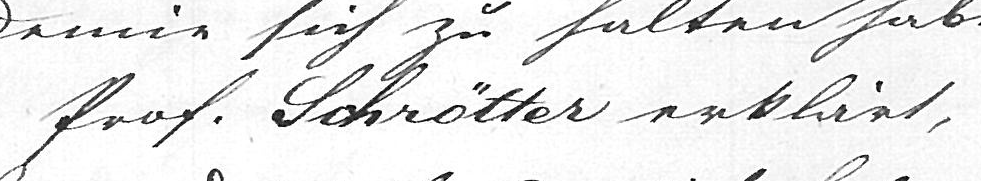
Prof. Schrötter erklärt,
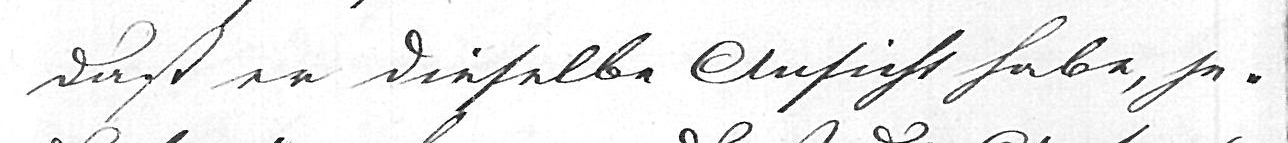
daß der dieselbe Ansicht habe, je-
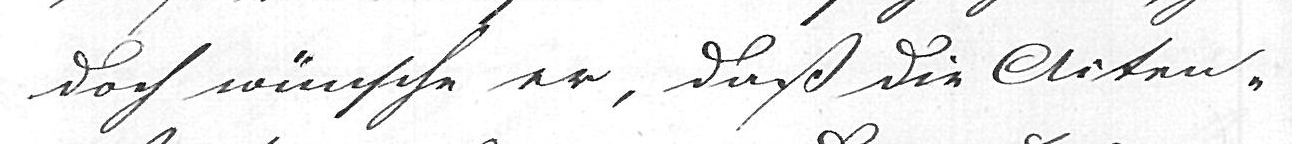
doch wünsche er, daß die Acten-
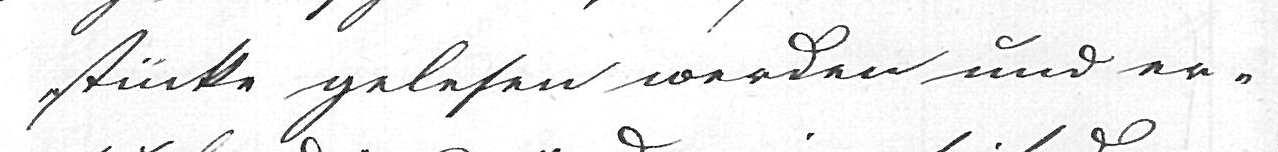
stücken gelesen werden und er-
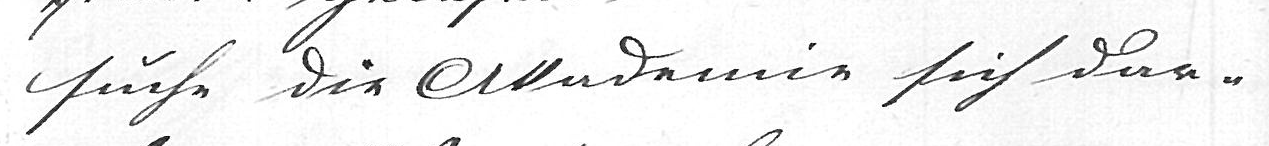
suche die Akademie sich dar-
